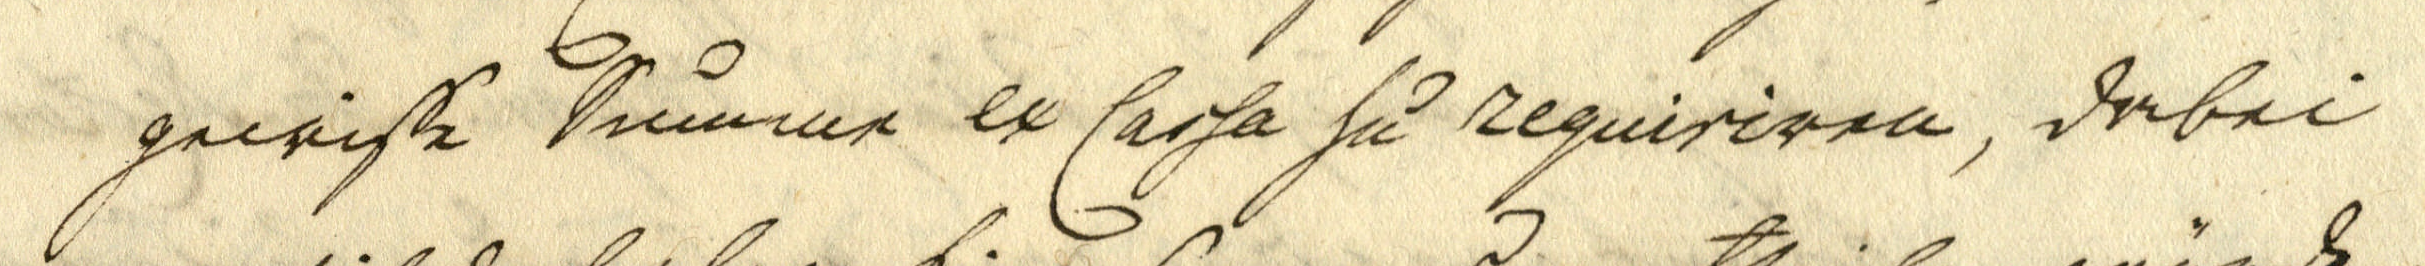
gewisse Summe ex Cassa zu requiriren, dabei
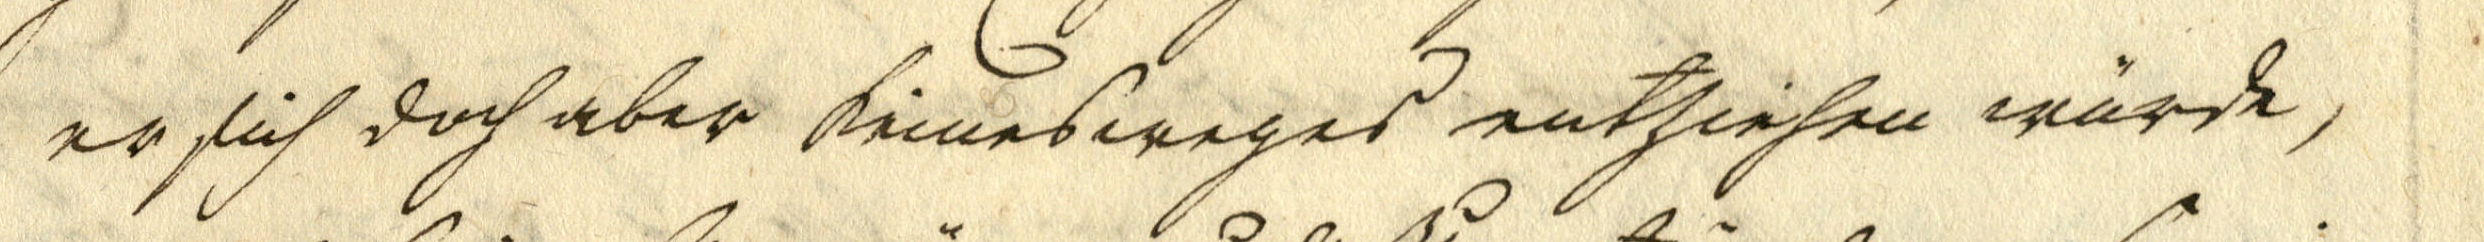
er sich doch aber keinesweges entziehen würde,
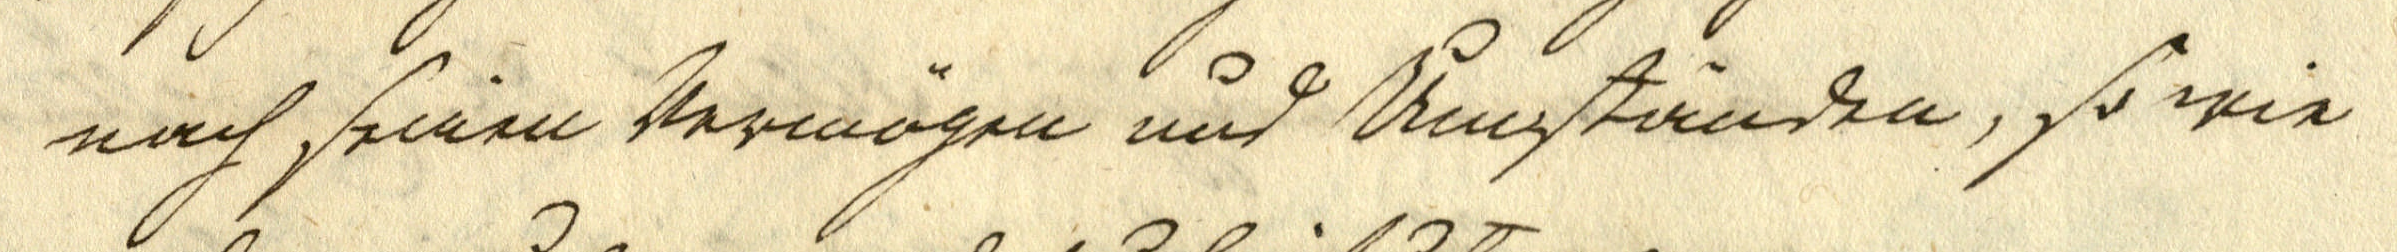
nach seinem Vermögen und Umständen, so wie
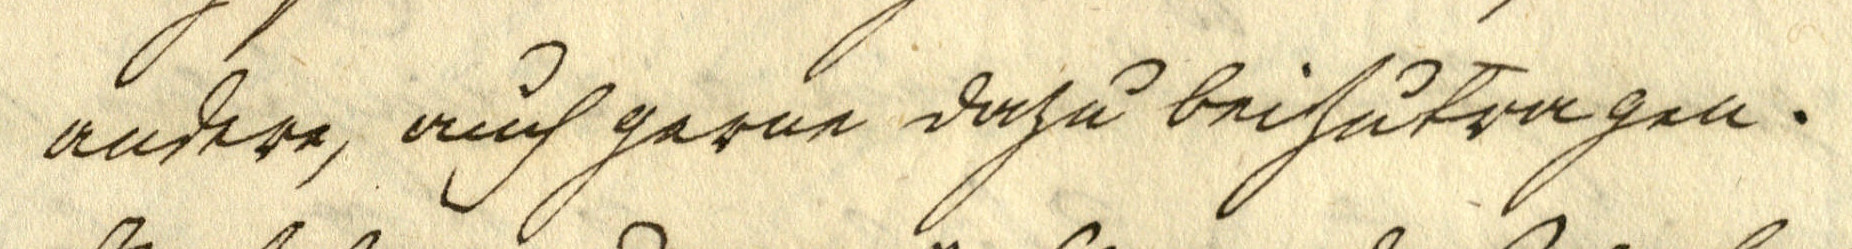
andere, auch gerne dazu beizutragen.
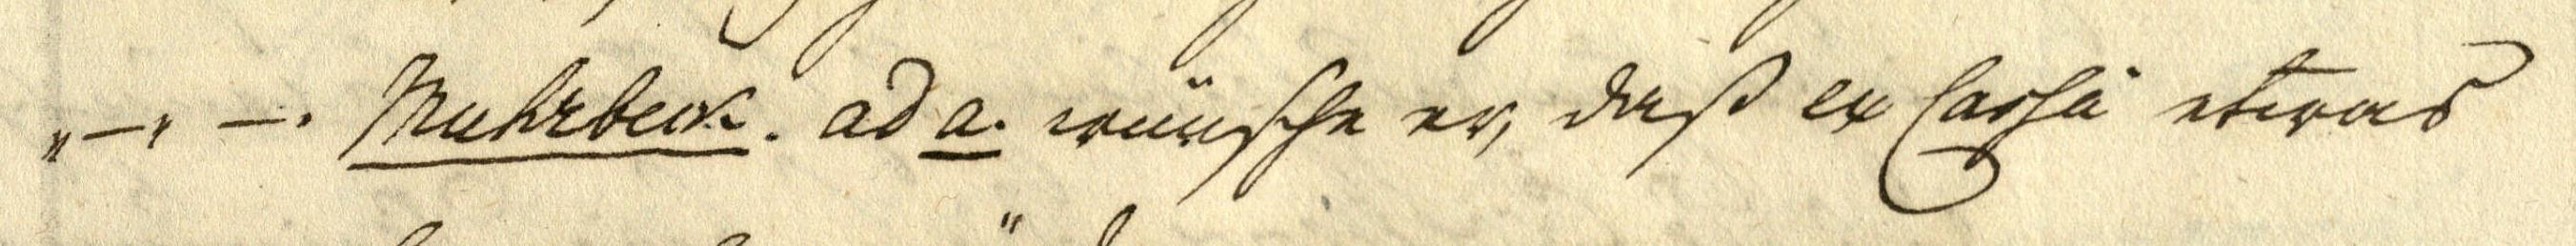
" - " - . Muhrbeck. ad a. wünsche er, daß ex Cassa etwas
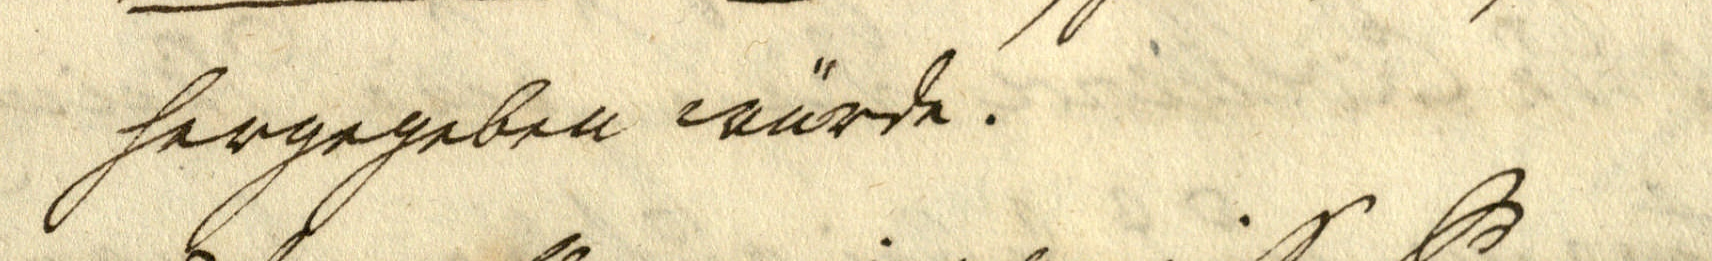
hergegeben würde.
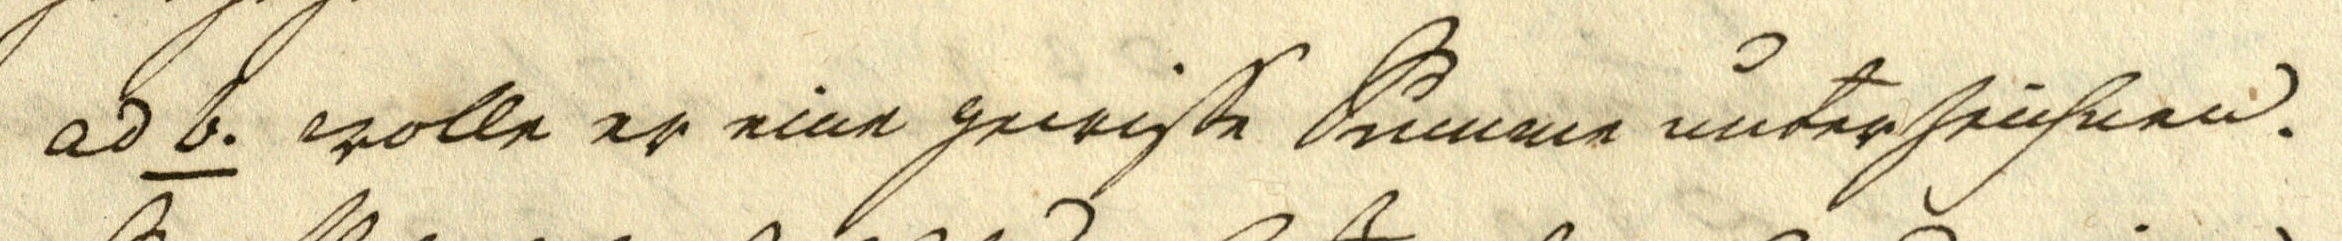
ad b. wolle er eine gewisse Summe unterzeichnen.
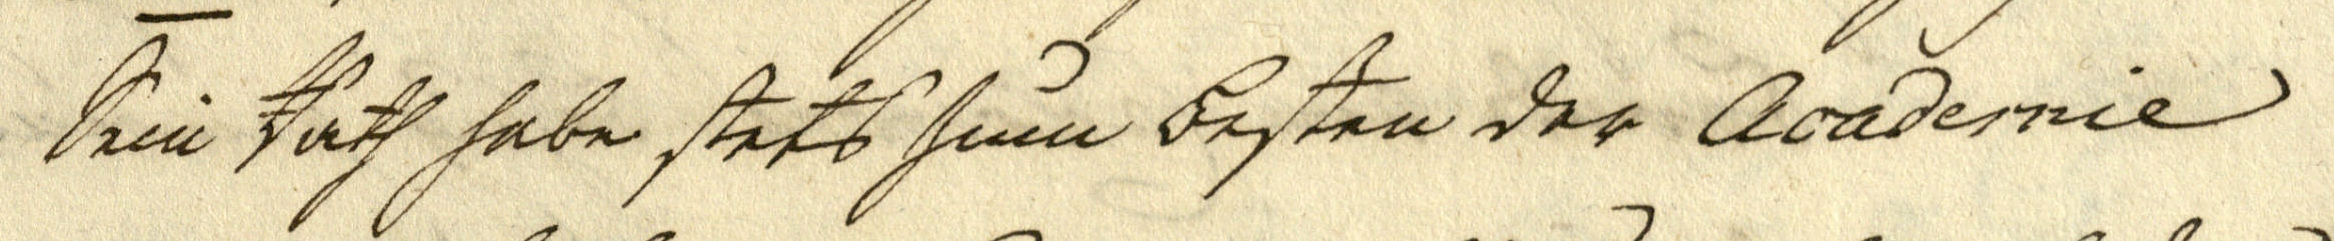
Sein Rath habe stets zum Besten der Academie
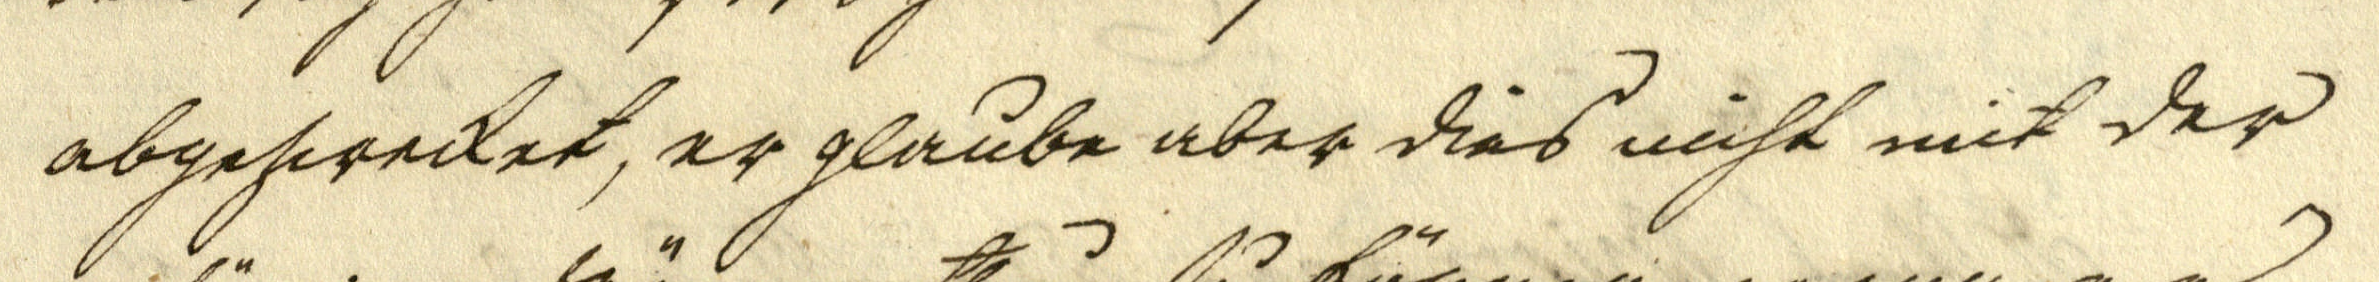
abgezwecket, er glaube aber dies nicht mit der
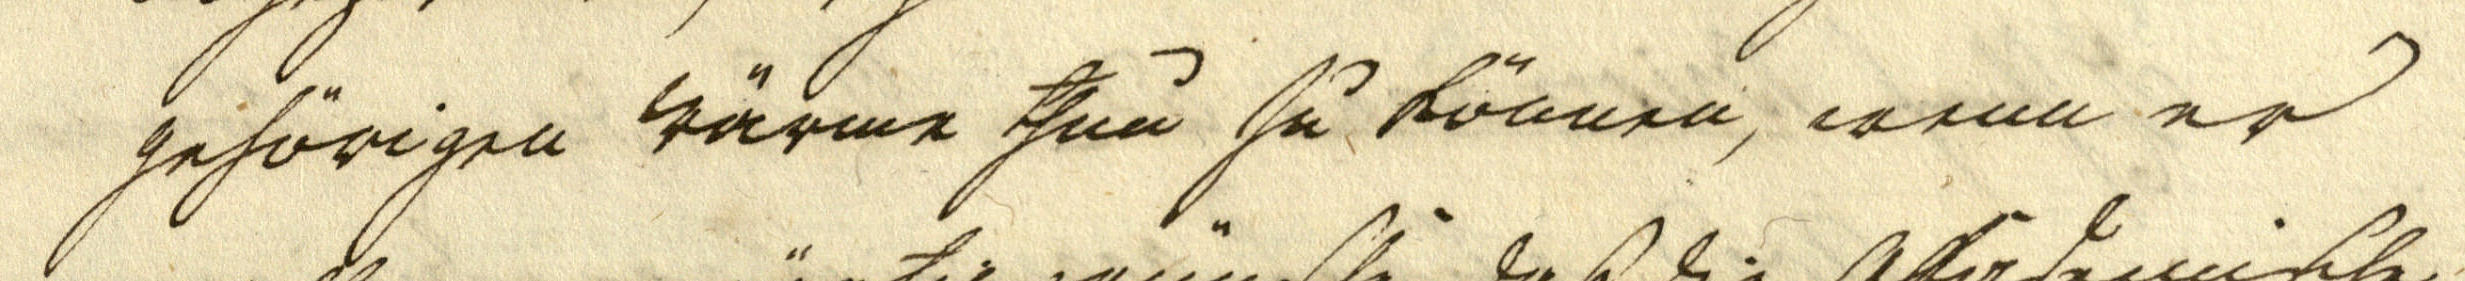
gehörigen Wärme thun zu können, wenn er
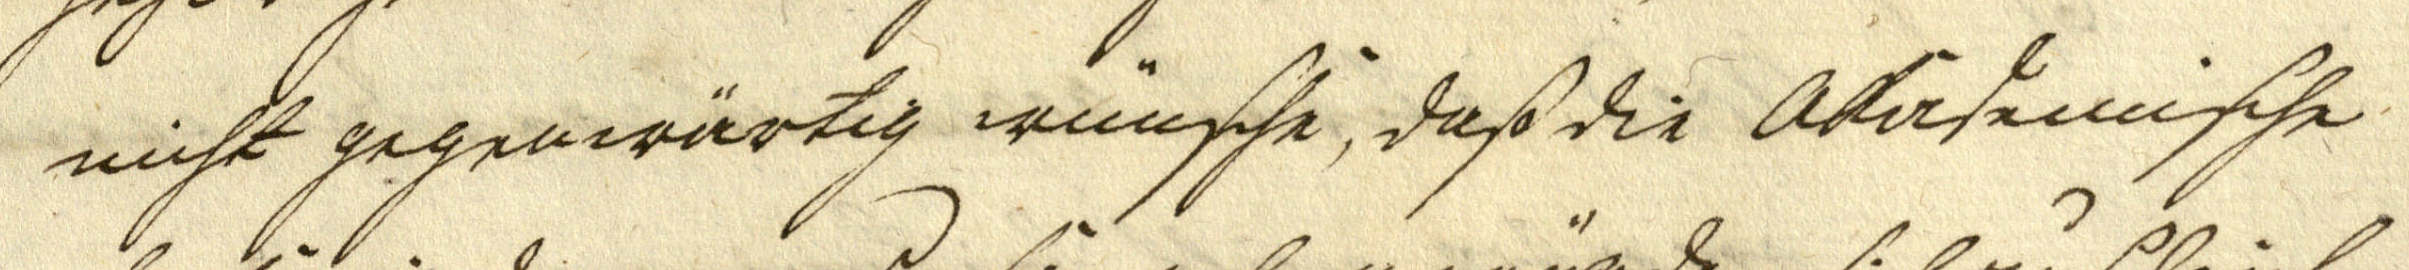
nicht gegenwärtig wünsche, daß die Akademische
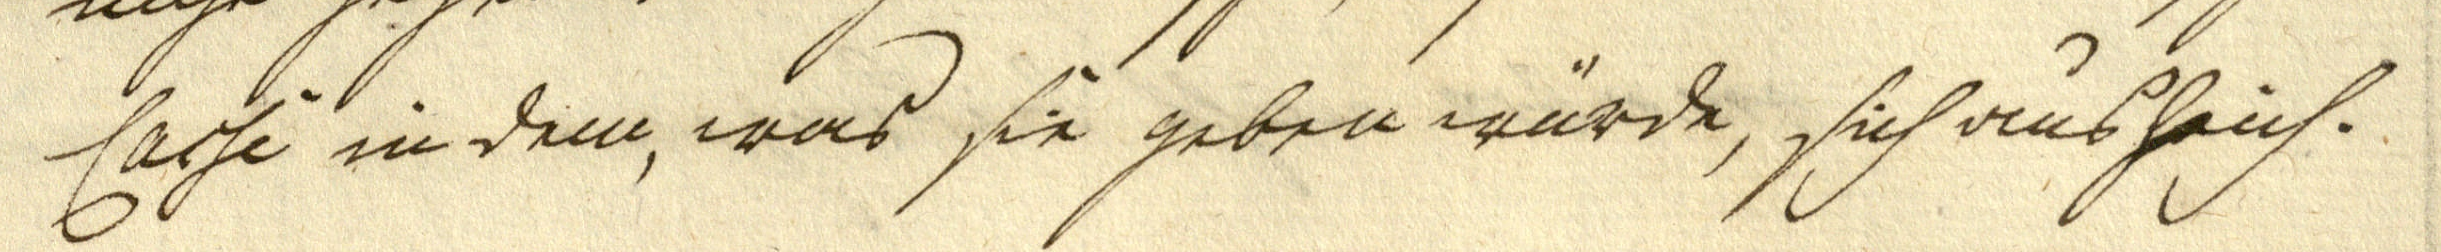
Casse in dem, was sie geben würde, sich auszeich-
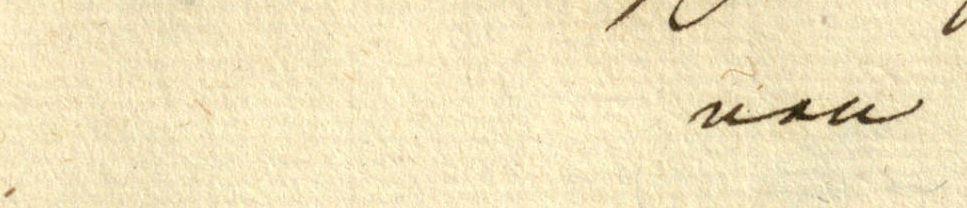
nen
